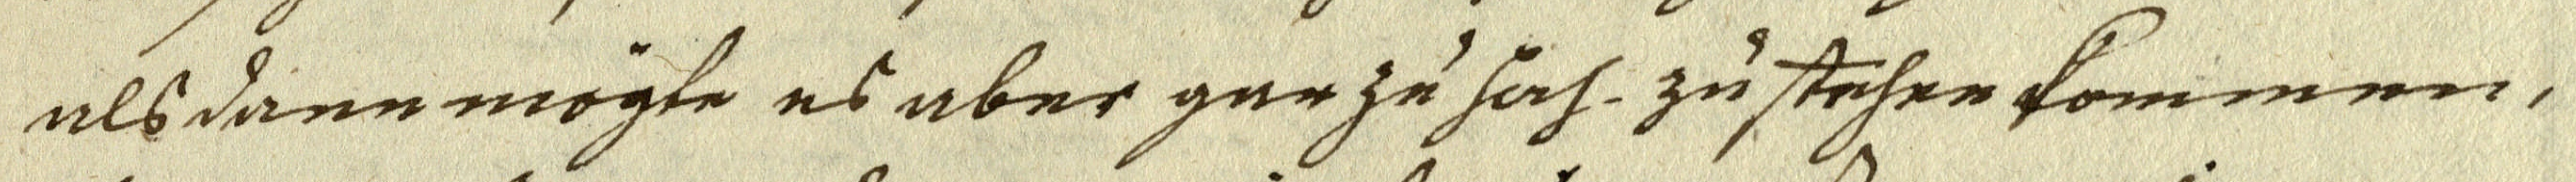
alsdann mögte es aber gar zu hoch zu stehen kommen,
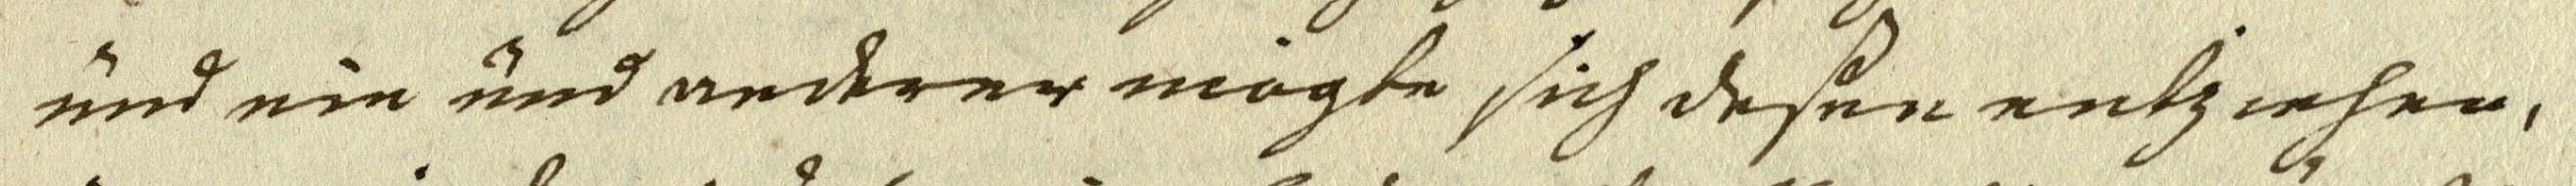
und ein und anderer mögte sich deßen entziehen,
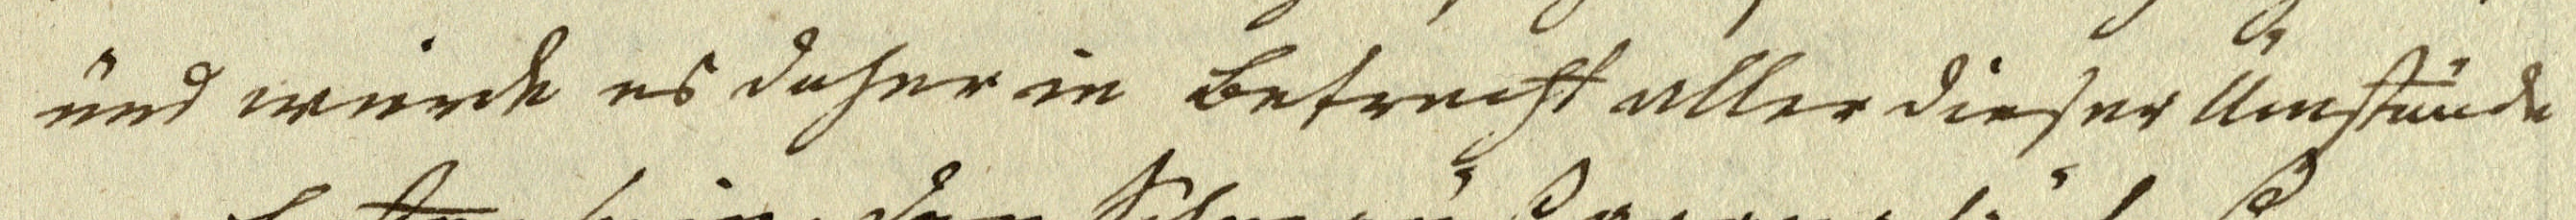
und würde es daher in Betracht aller dieser Umstände
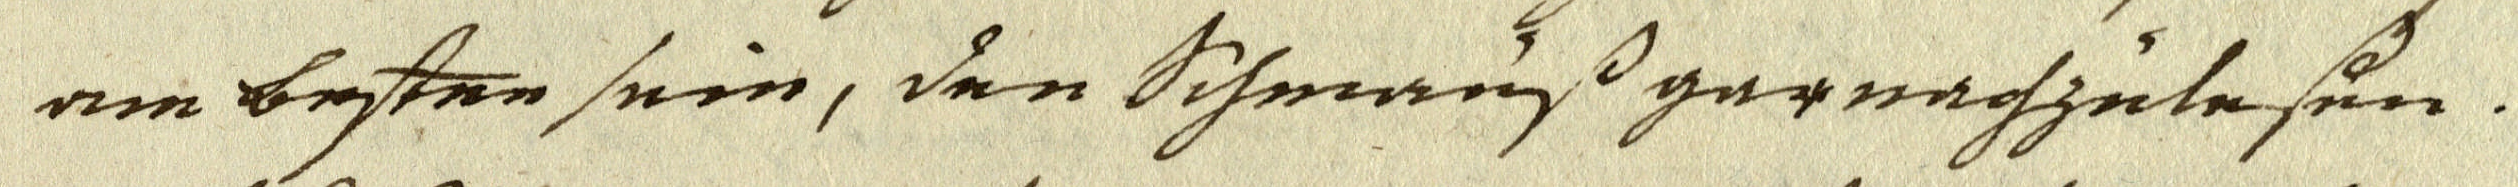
am besten sein, den Schmauß gar nachzulassen.
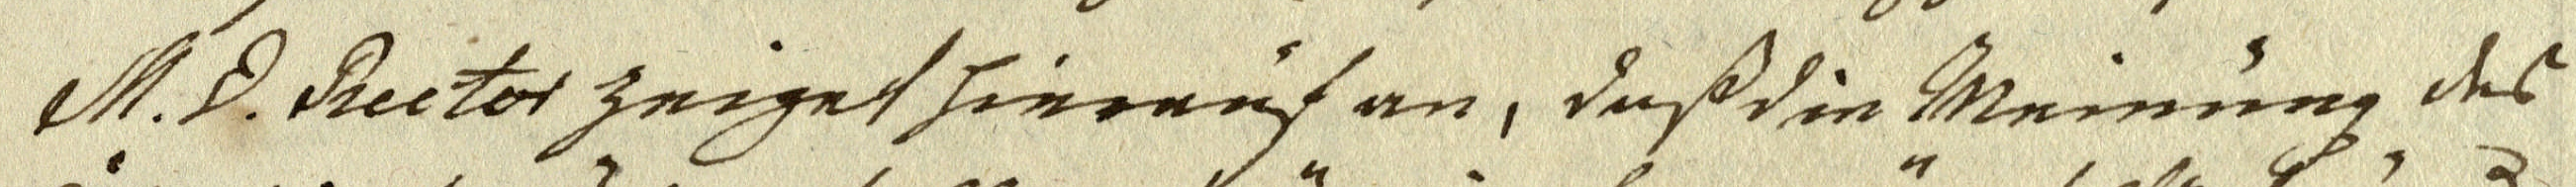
M. D. Rector zeiget hierauf an, daß die Meinung des
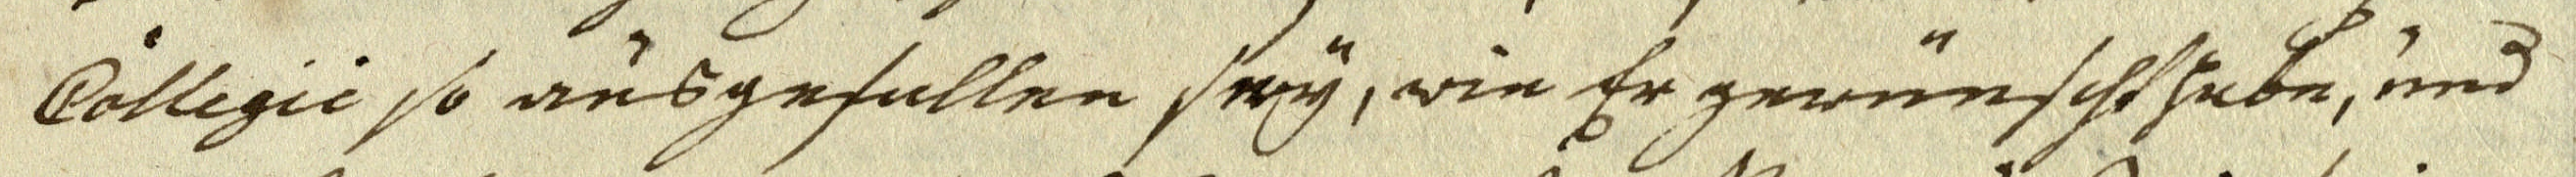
Collegii so ausgefallen seÿ, wie Er gewünscht habe, und
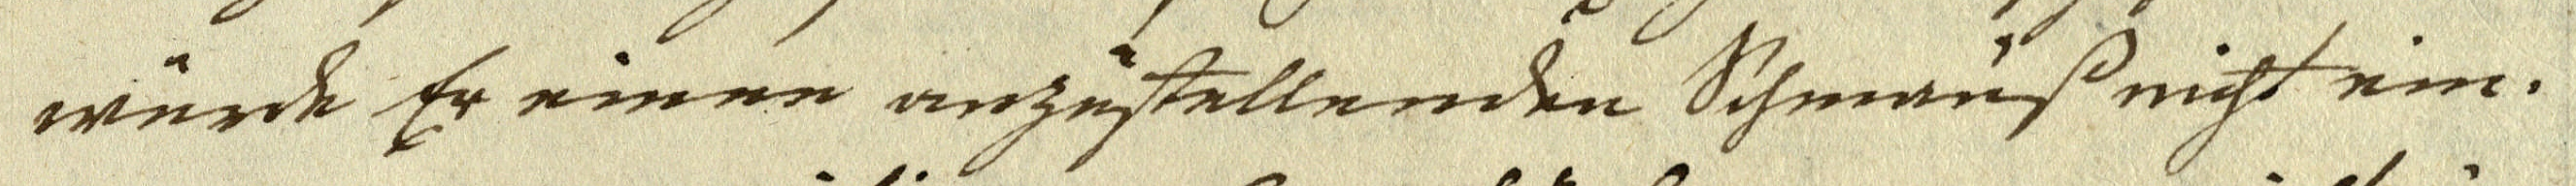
würde Er einen anzustellenden Schmauß nicht ein¬
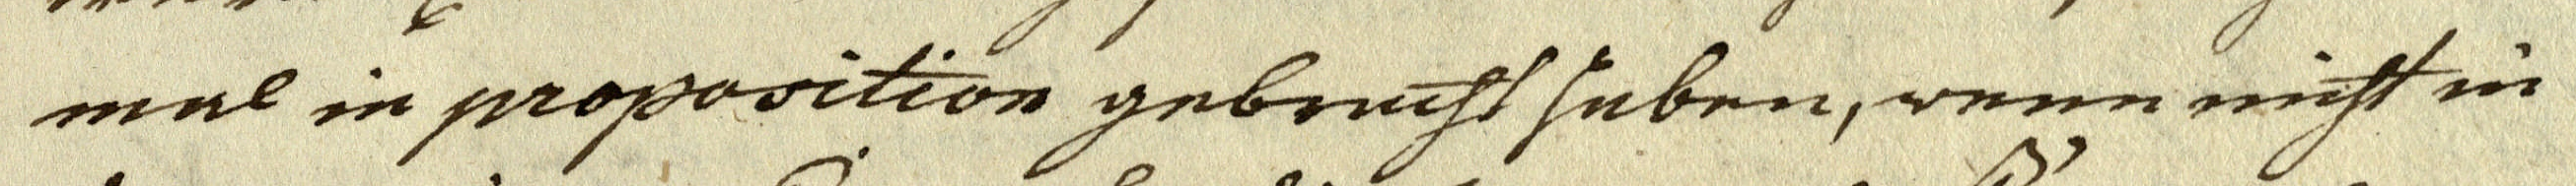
mal in proposition gebracht haben, wenn nicht in
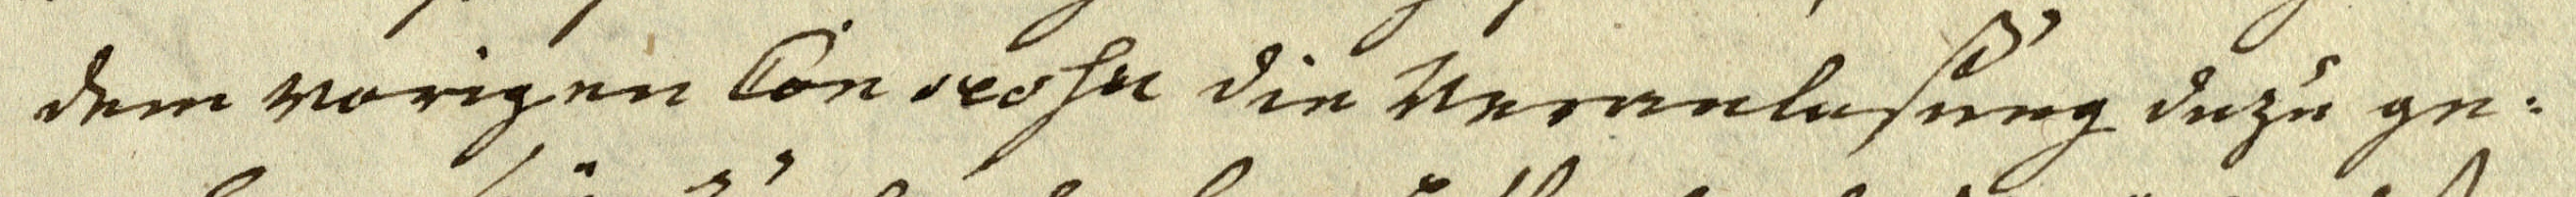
dem vorigen Consessu die Veranlaßung dazu ge¬
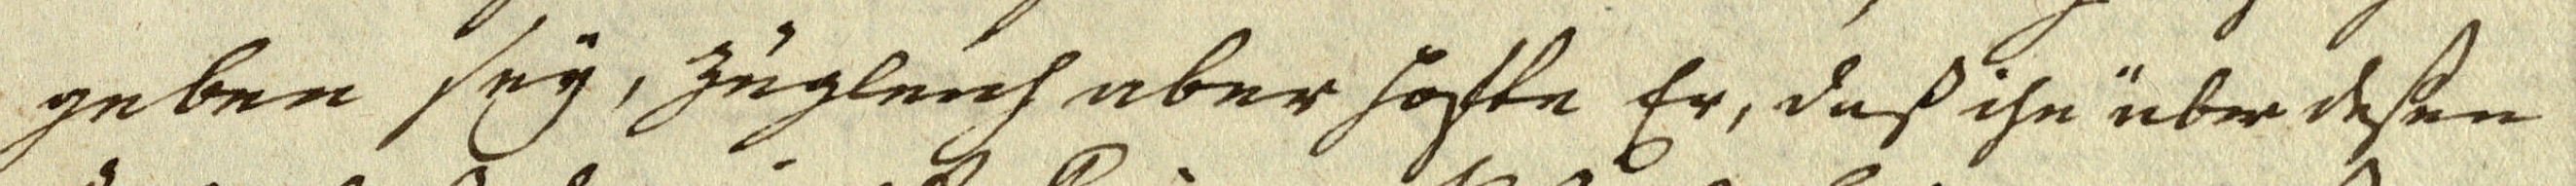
geben seÿ, zugleich aber hofte Er, daß ihn über deßen
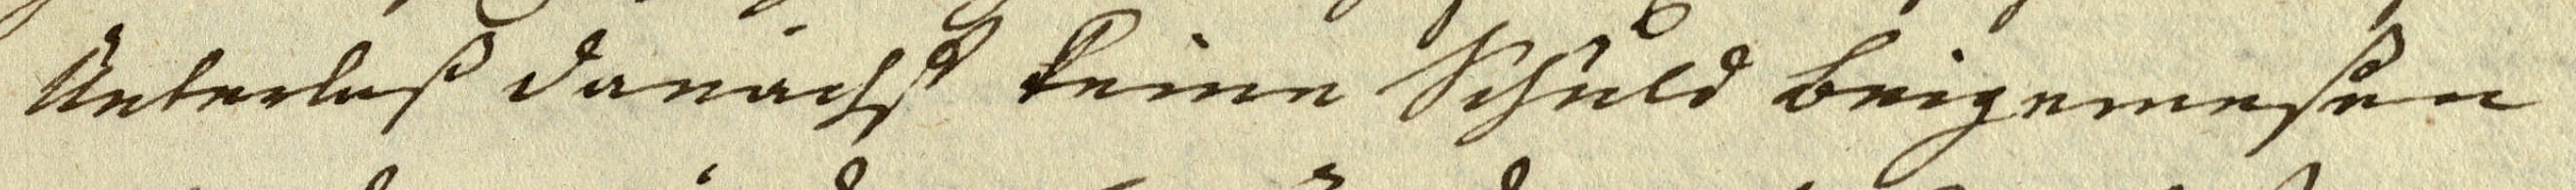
Unterlaß danächst keine Schuld beigemeßen
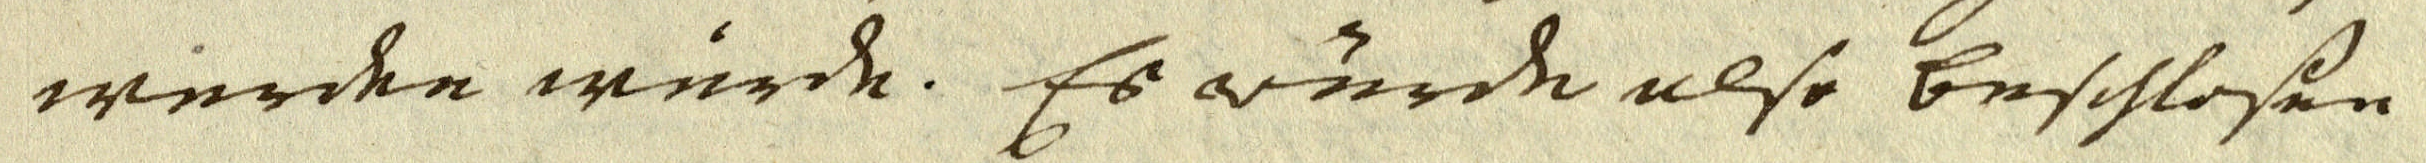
werden würde. Es wurde also beschloßen,
